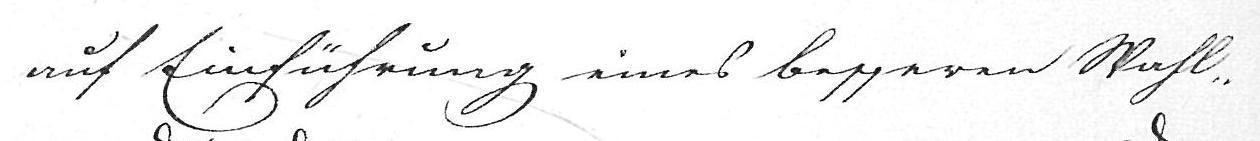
auf Einführung eines besseren Wahl-
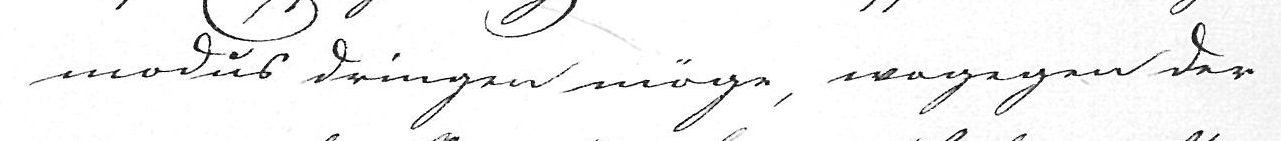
modus dringen möge, wogegen der
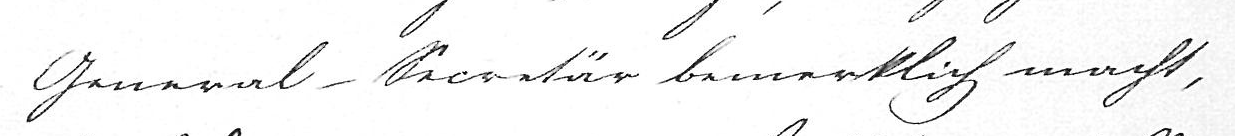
General-Secretär bemerklich macht,
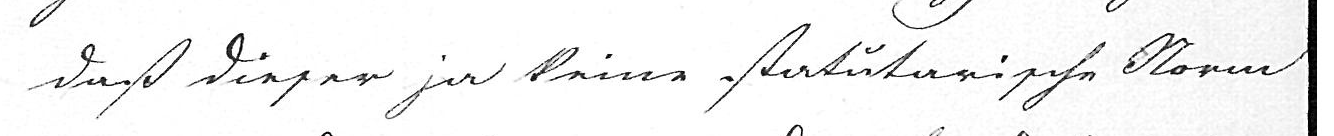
daß dieser ja keine statutarische Norm
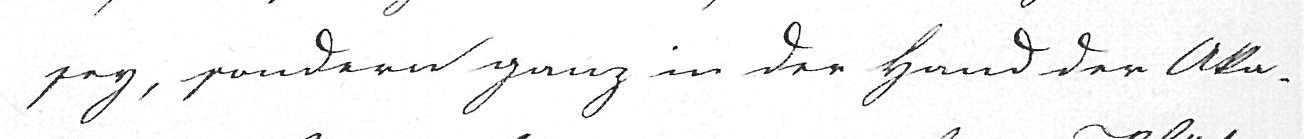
sey, sondern ganz in der Hand der Aka-
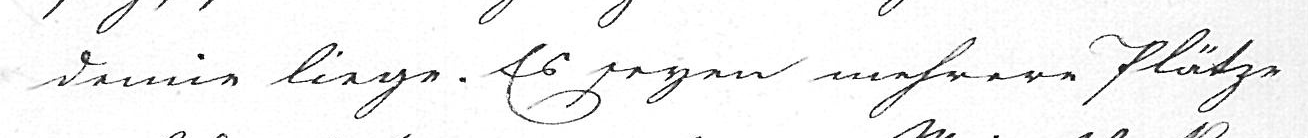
demie liege. Es seyen mehrere Plätze
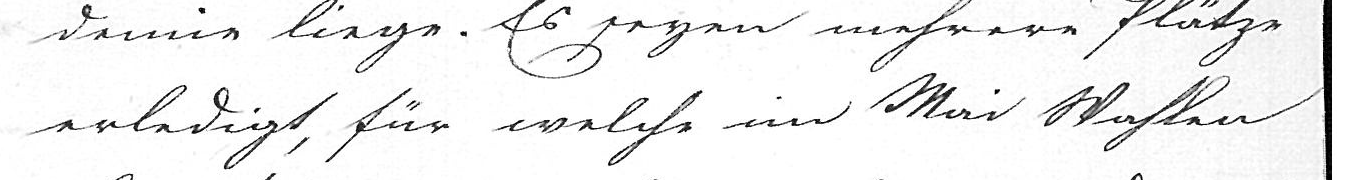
erledigt, für welche im Mai Wahlen
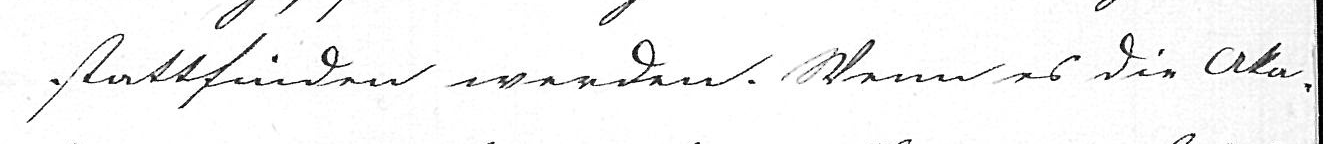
stattfinden werden. Wenn es die Aka-
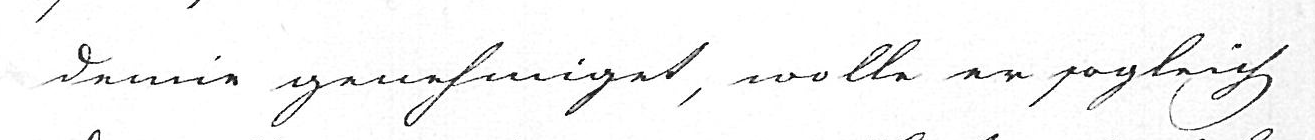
demie genehmiget, wolle er sogleich
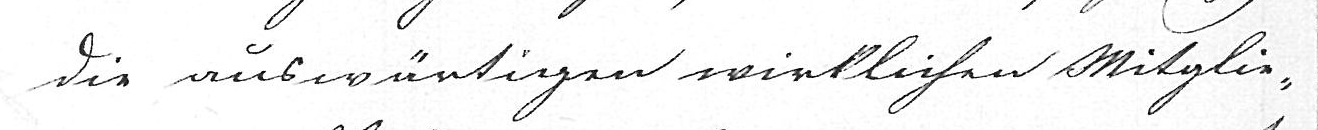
die auswärtigen wirklichen Mitglie-
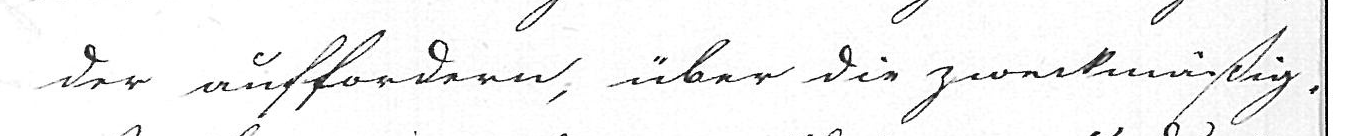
der auffordern, über die zweckmäßig-
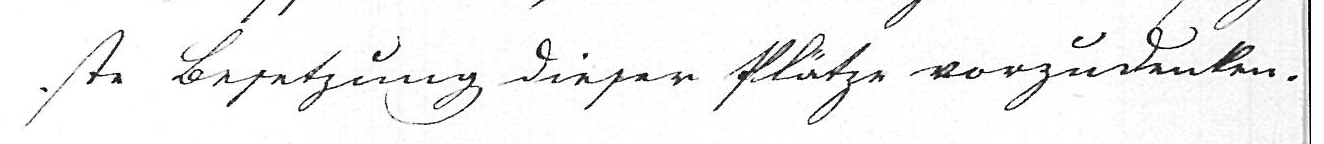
ste Besetzung dieser Plätze vorzudenken.
